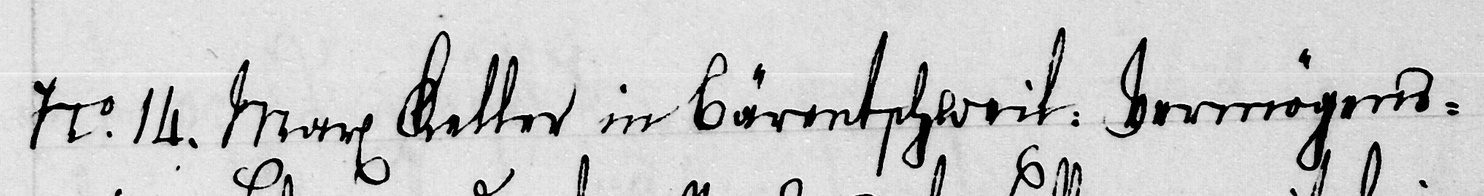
No. 14. Marx Keller in Bärentschweil. Vermögenss¬
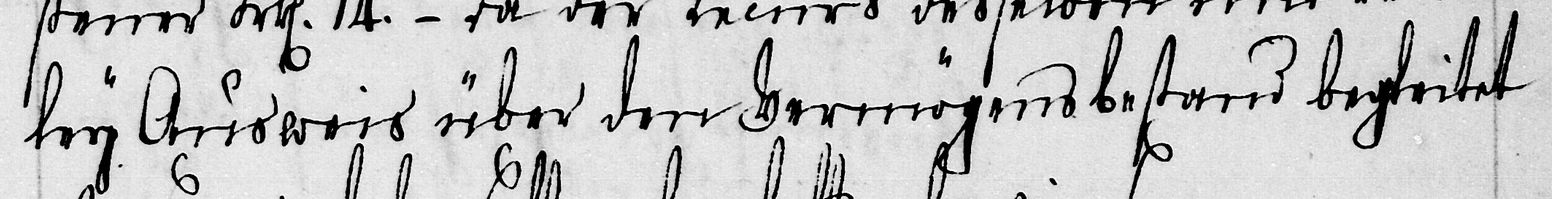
ley Ausweis über den Vermögensbestand begleitet
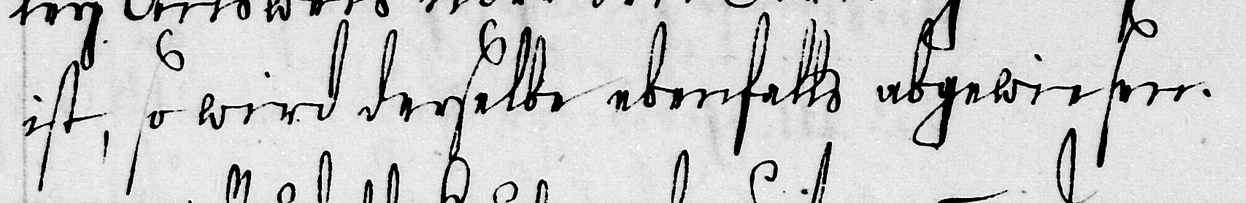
ist, so wird derselbe ebenfalls abgewiesen.
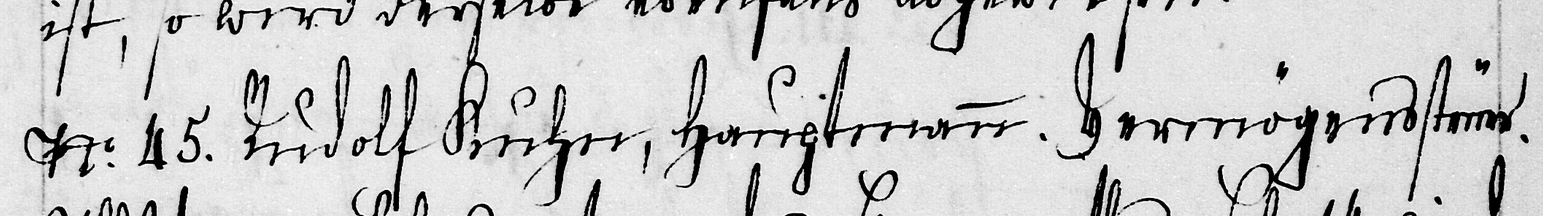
No. 45. Rudolf Kuhn, Hauptmann. Vermögenssteue¬
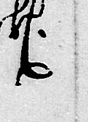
12.
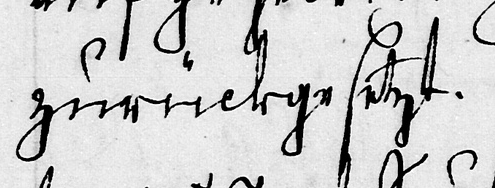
zurückgesetzt.
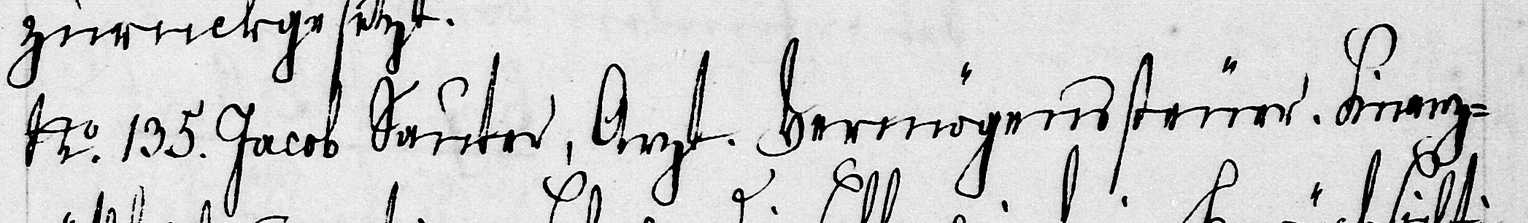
No. 135. Jacob Sauter, Arzt. Vermögenssteuer. Finanz¬
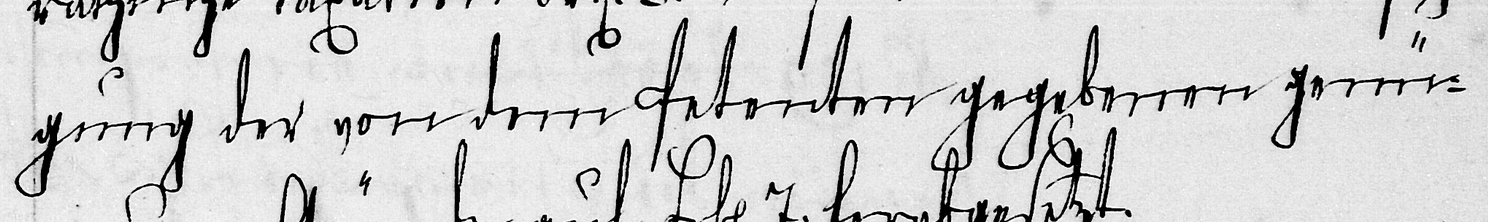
gung der von dem Petenten gegebenen genü¬
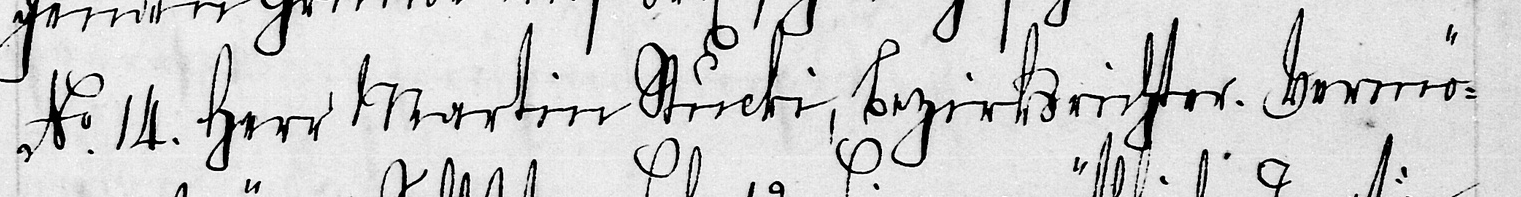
No. 14. Herr Martin Stucki, Bezirksrichter. Vermö¬
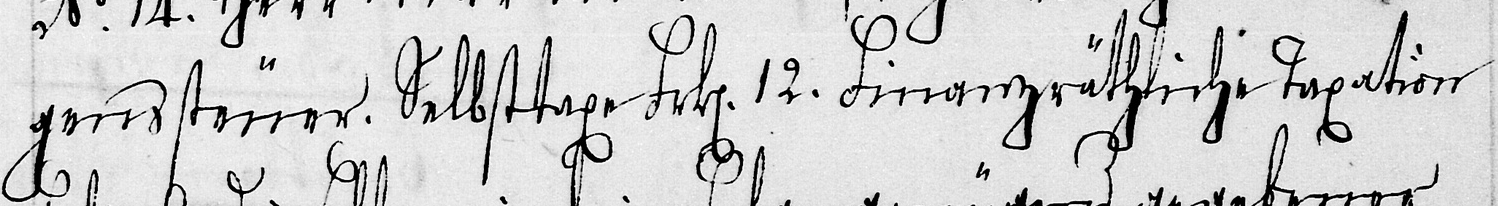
genssteuer. Selbsttaxe Frk[en]. 12. Finanzräthliche Taxation
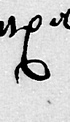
6.
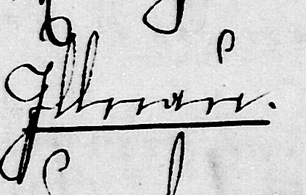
Illnau.
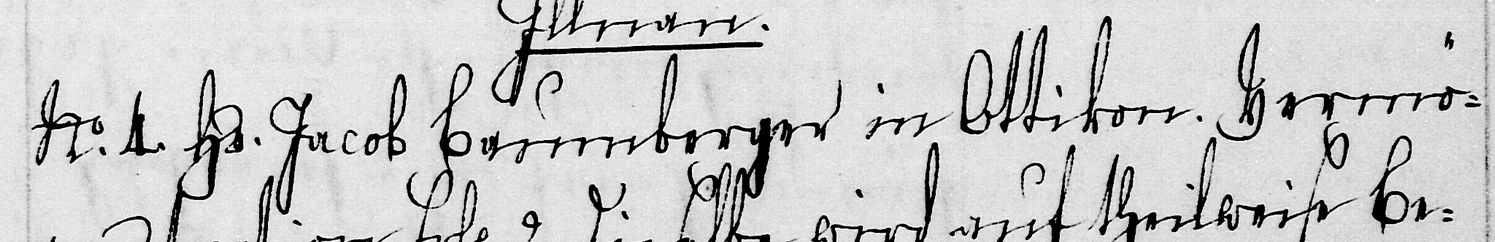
No. 4. Hs. Jacob Baumberger in Ottikon. Vermö¬
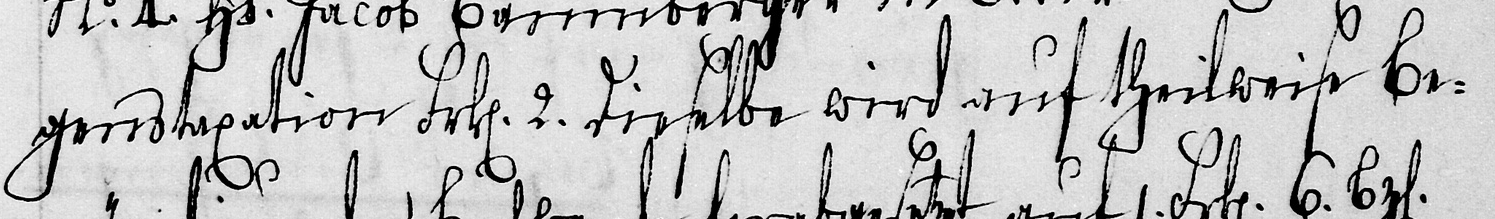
genstaxation Frk[en]. 2. Dieselbe wird auf theilweise Be¬
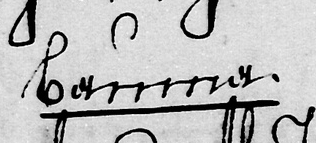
Bauma.
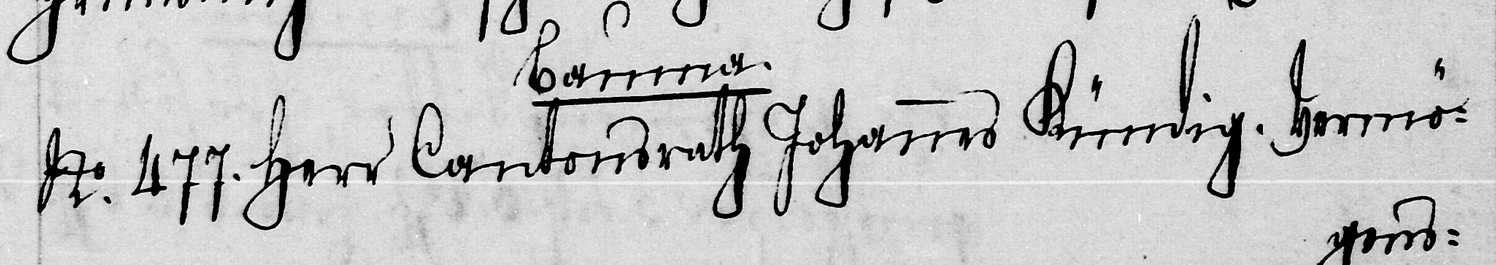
No. 477. Herr Cantonsrath Johannes Kündig. Vermö-
